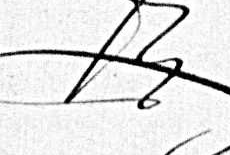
FJ
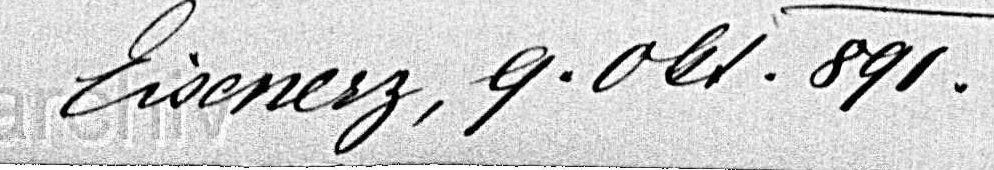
Eisenerz, 9. Okt 1891
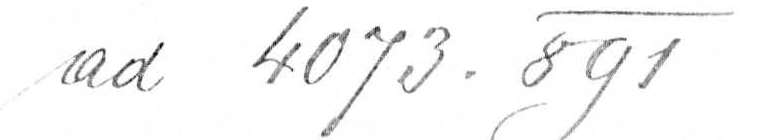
ad 4073 1891
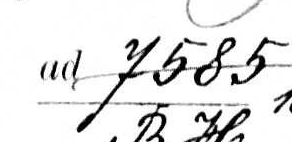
ad 7585/ –
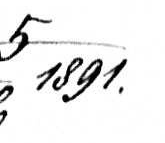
1891
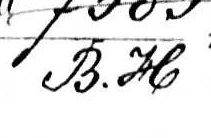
BH
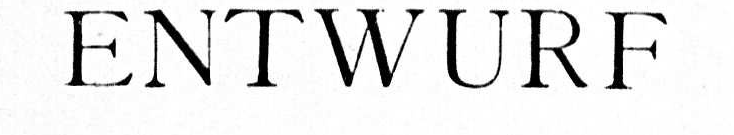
Entwurf
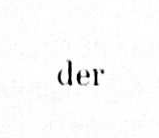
Der
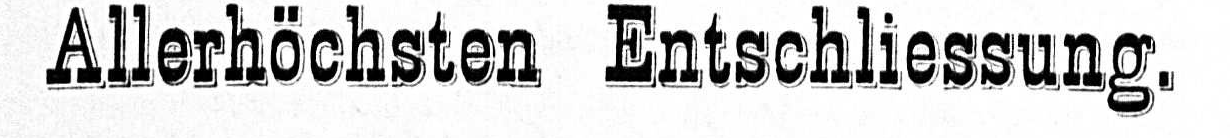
Allerhöchsten Entschliessung
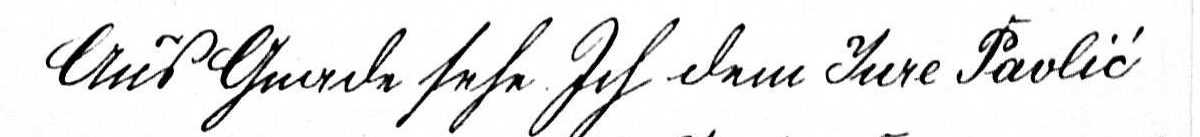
Aus Gnade sehe Ich dem Jure Pavlić
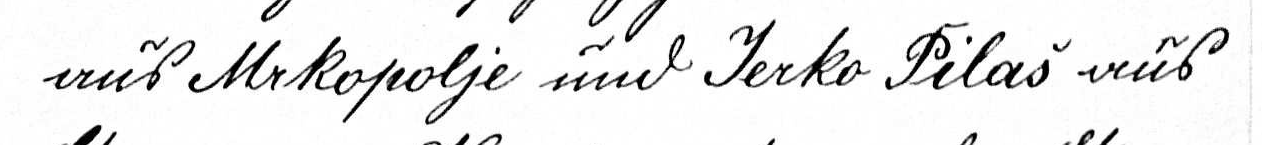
aus Mrkopolje und Jerko Pilaš aus
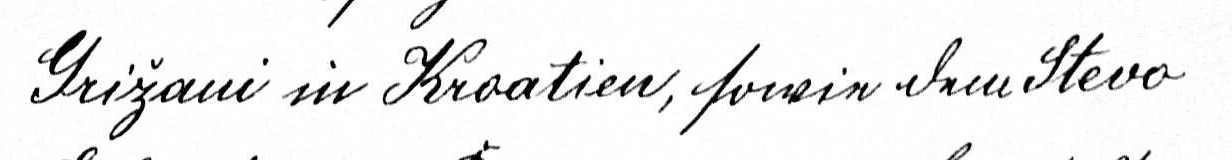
Grižani in Kroatien, sowie dem Stevo
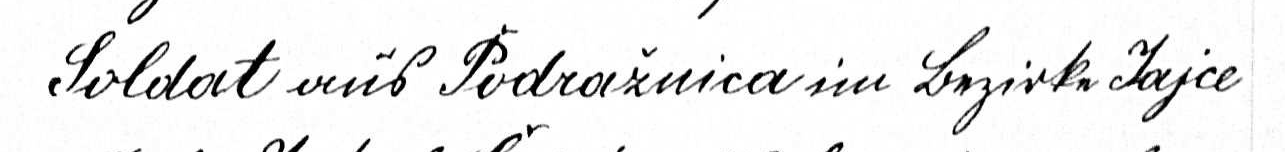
Soldat aus Podražnica im Bezirke Jajce
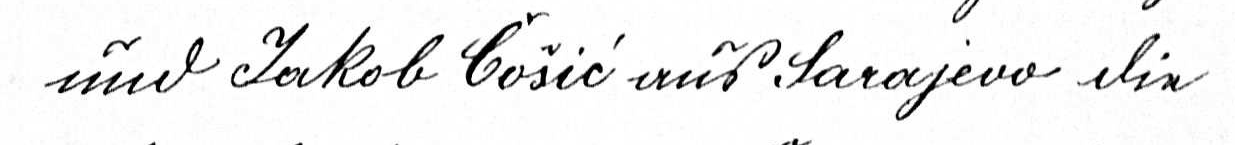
und Jakob Čošić aus Sarajevo die,
